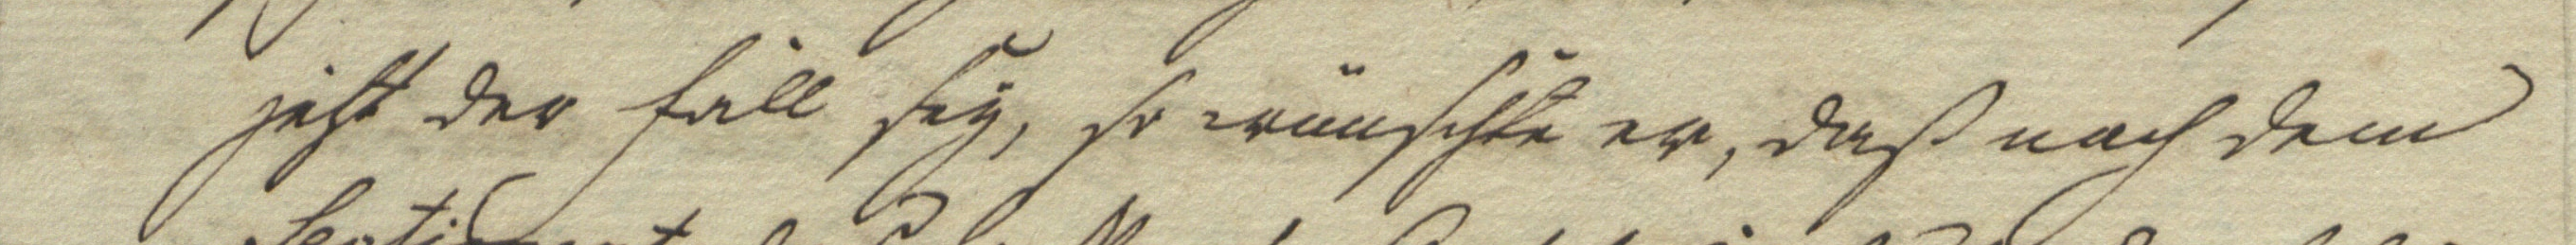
jetzt der Fall sey, so wünsche er, daß nach dem
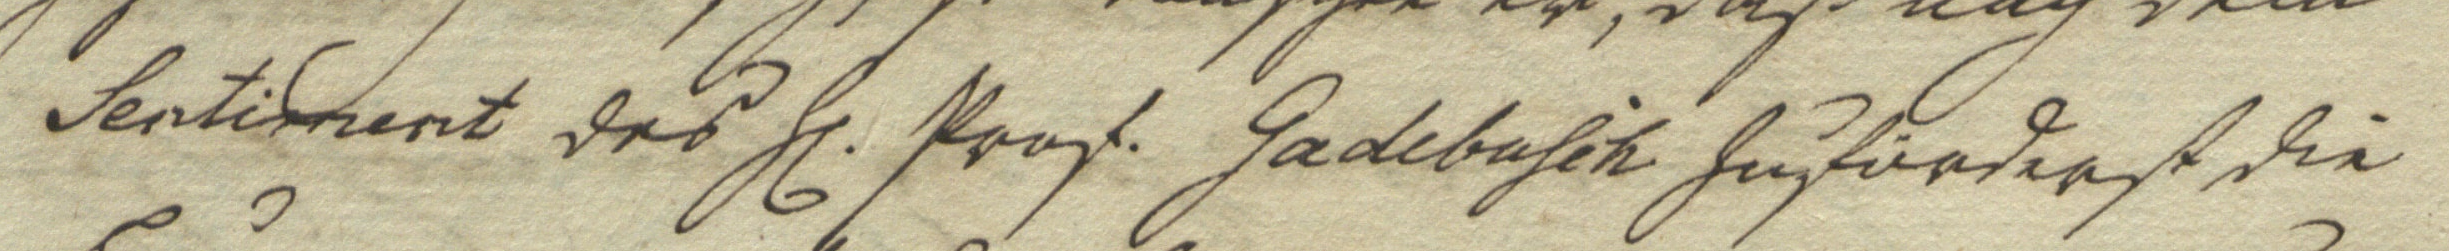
Sentiment des H. Prof. Gadebusch zuförderst die
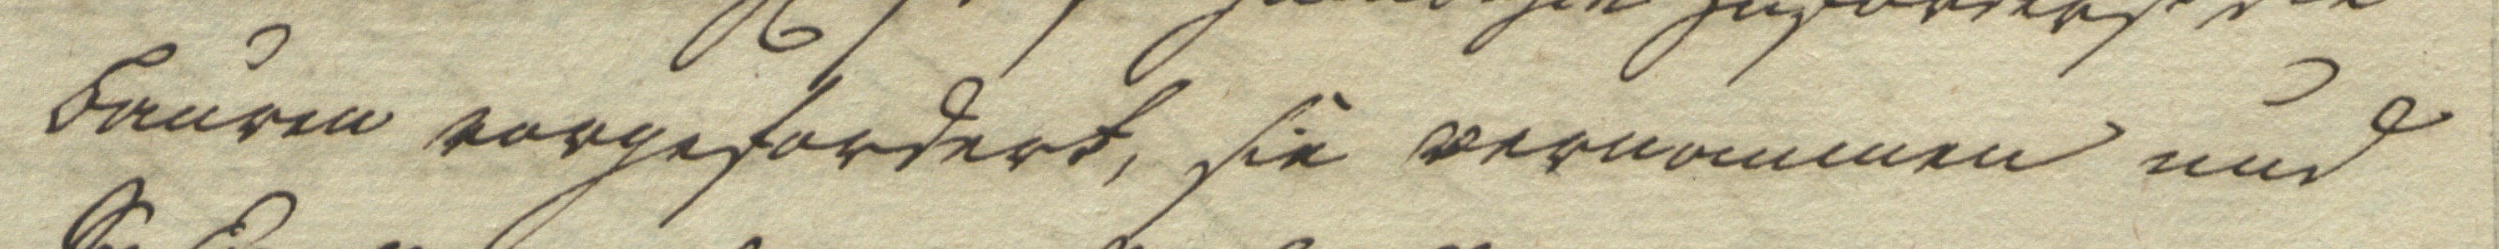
Bauren vorgefordert, sie vernommen und
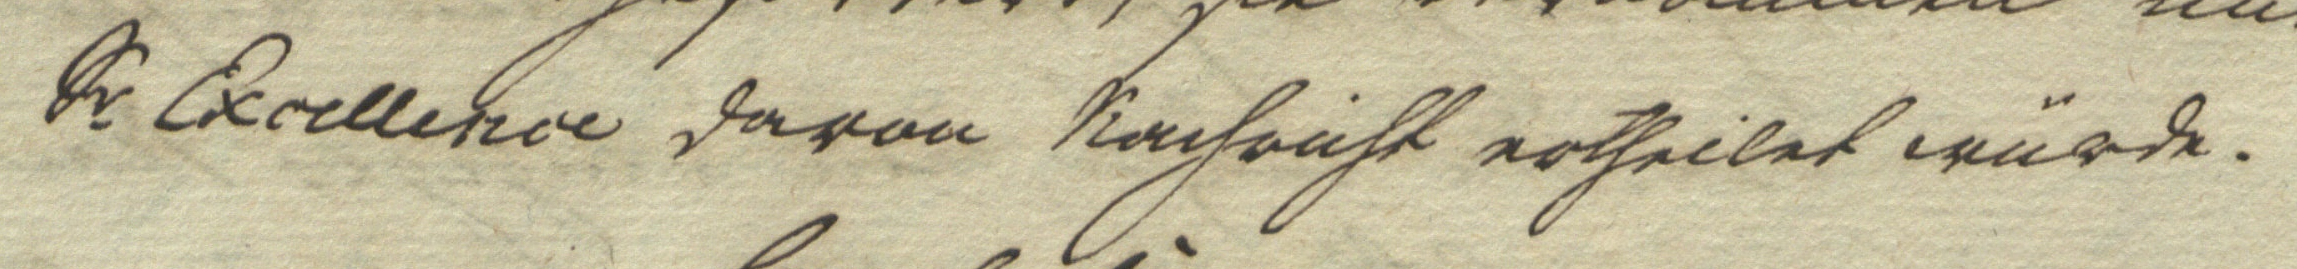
Sr. Excellence davon Nachricht ertheilet würde.
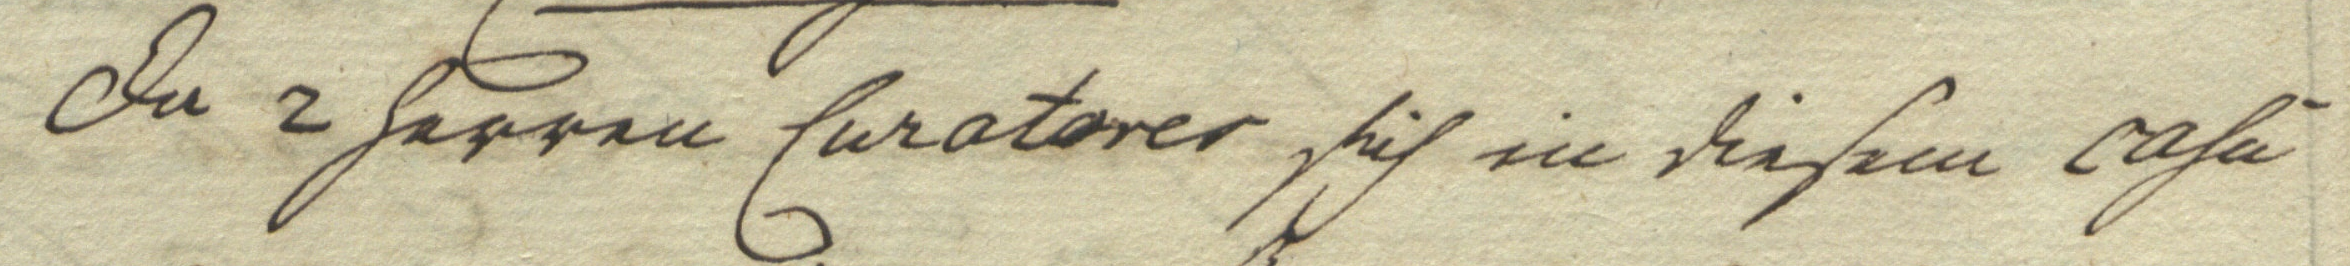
Da 2 Herren Curatores sich in diesem casu
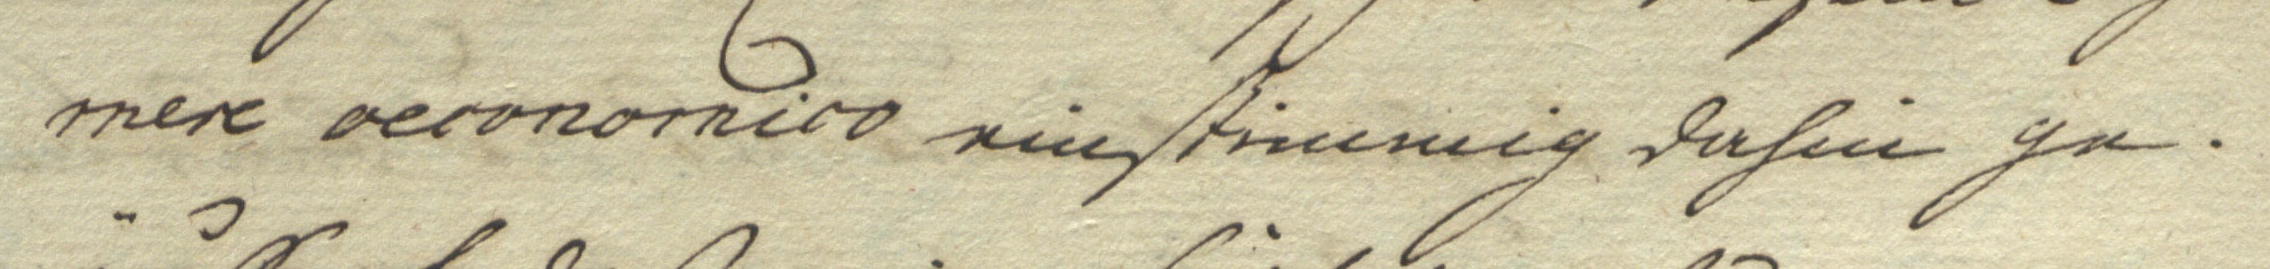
mere oeconomico einstimmig dahin ge¬
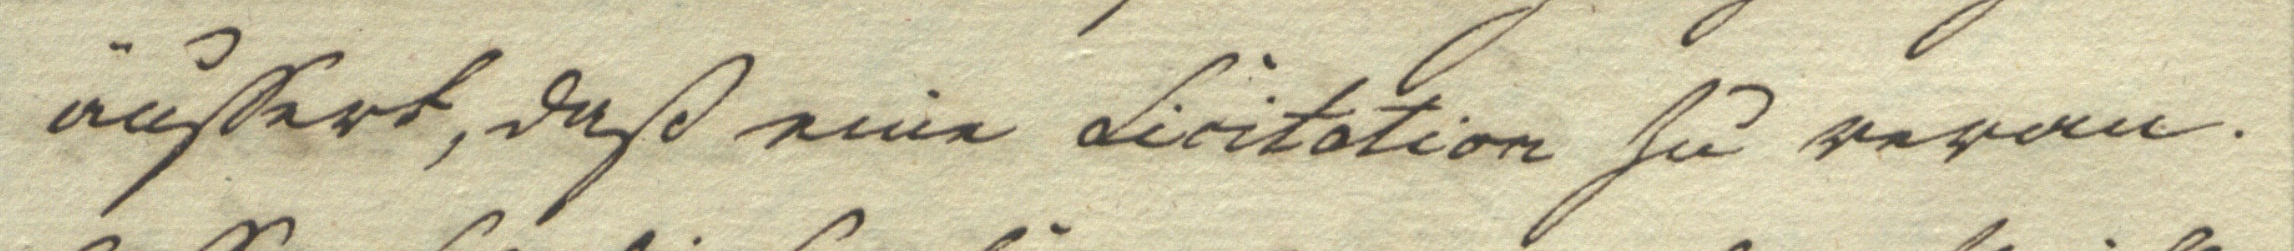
äussert, daß eine Licitation zu veran¬
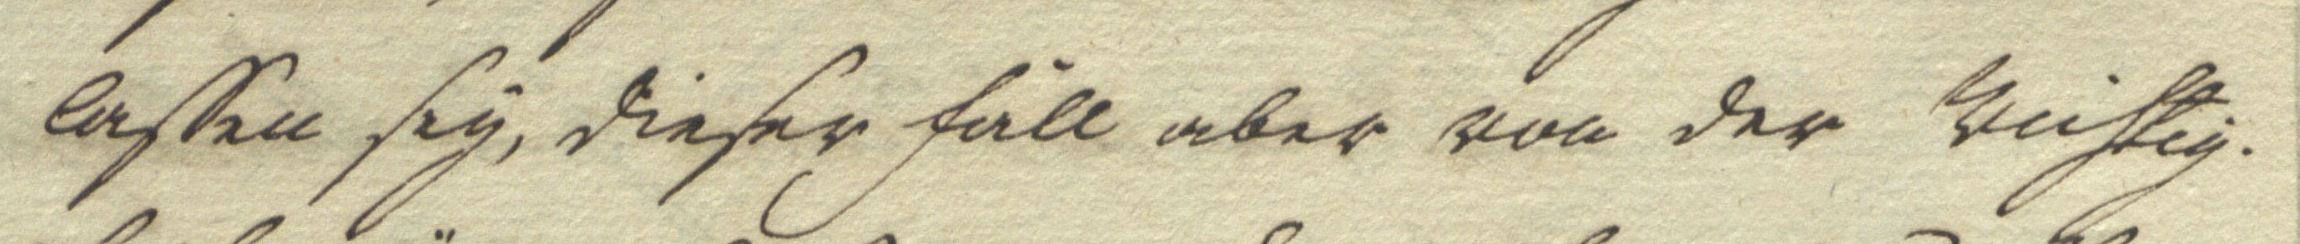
lassen sey, dieser Fall aber von der Wichtig¬
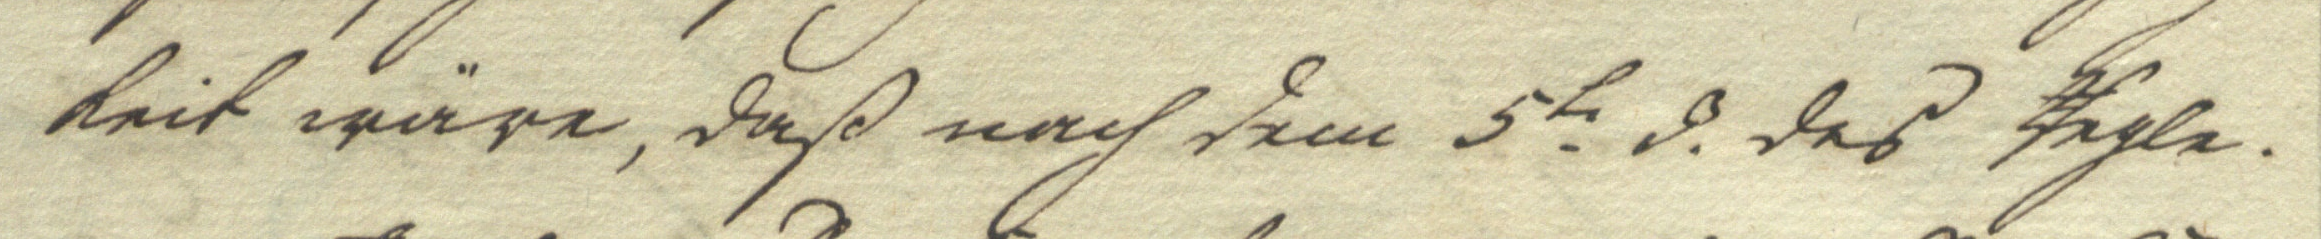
keit wäre, daß nach dem 5ten § des Regle¬
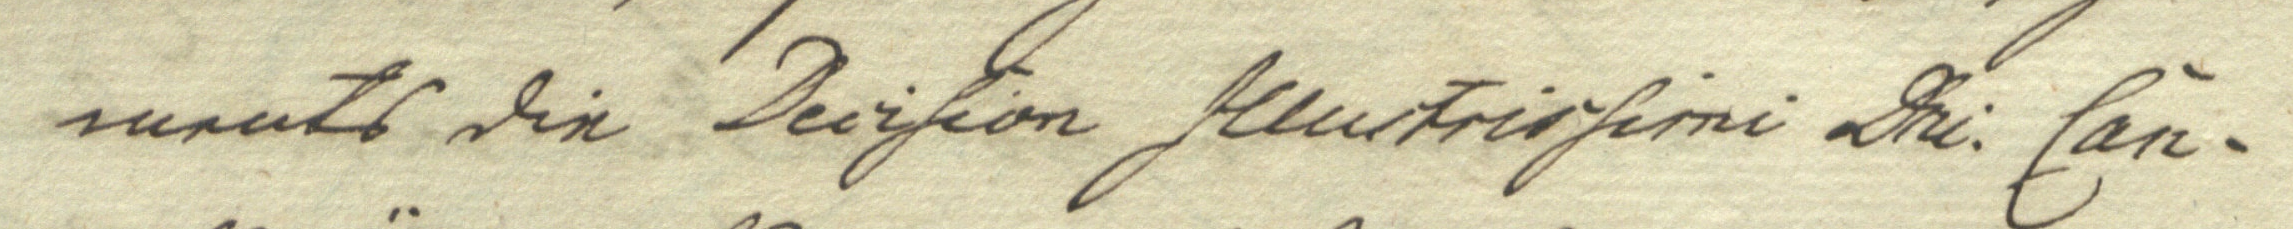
ments die Decision Illustrissimi Dni. Can¬
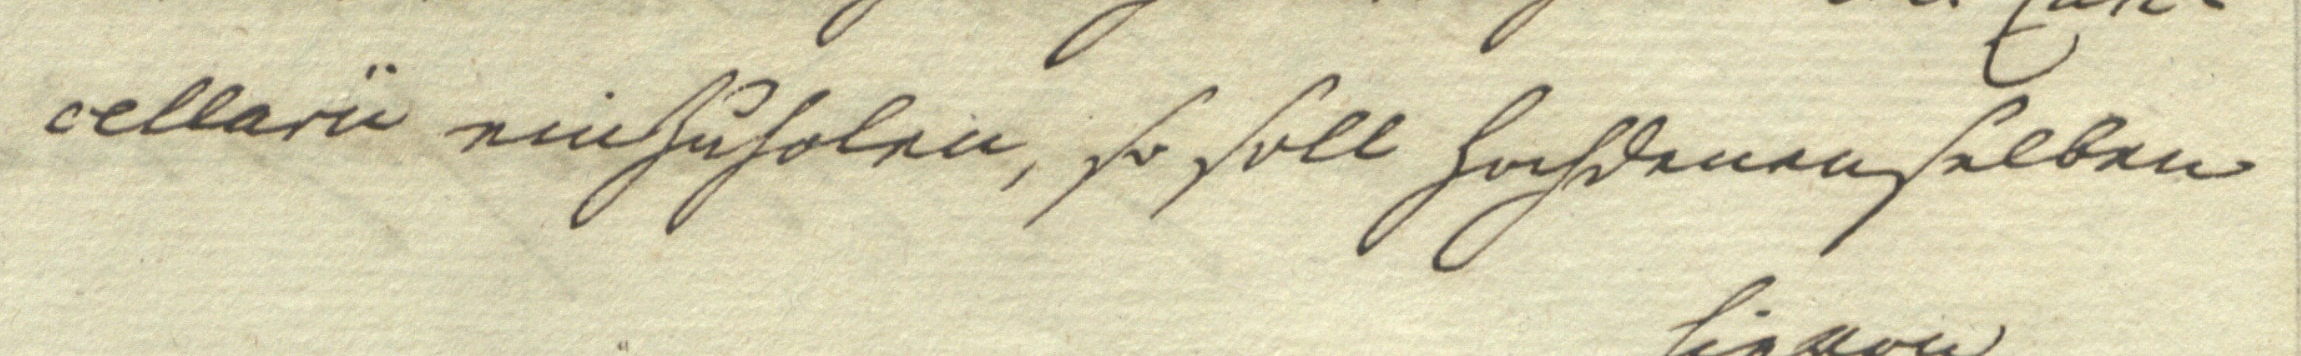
cellarii einzuholen, so soll hochdenenselben
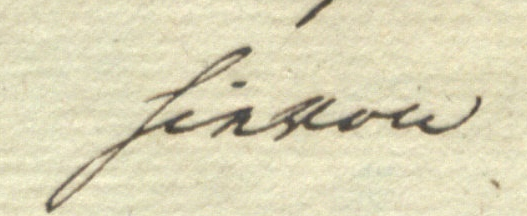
hievon
